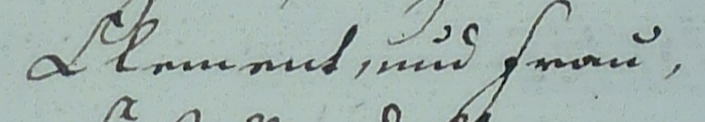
Clement, und Frau,
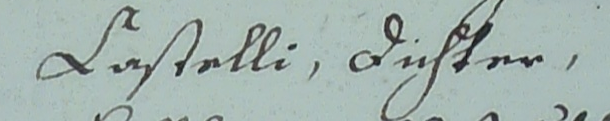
Castelli, Dichter,
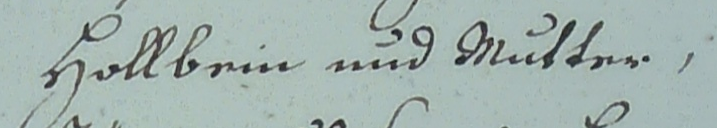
Hollbein und Mutter,
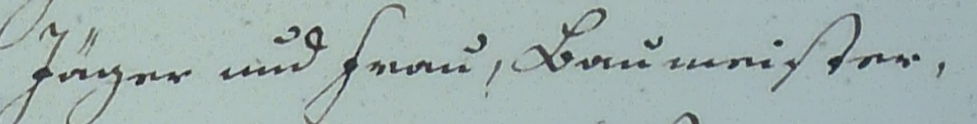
Jäger und Frau, Baumeister,
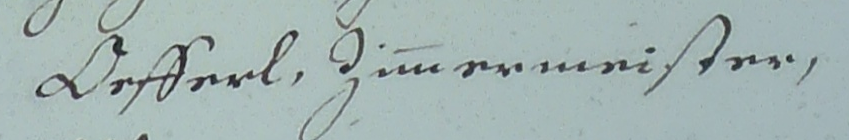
Oefferl. Zim̅ermeister,
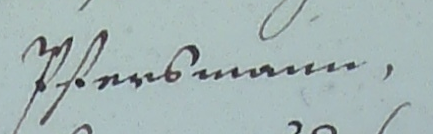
Pfersmann,
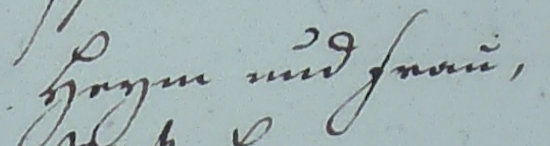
Heym und Frau,
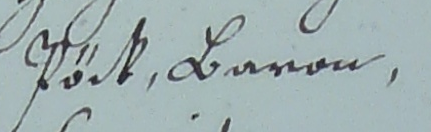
Pöck, Baron,
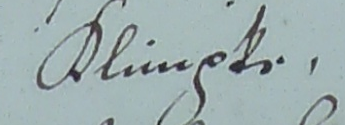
Klimpke,
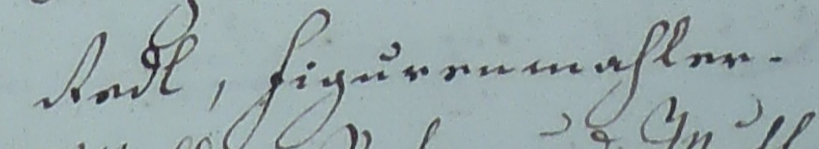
Redl, Figurenmahler.
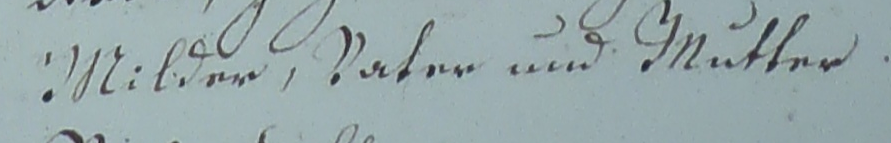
Milder, Vater und Mutter
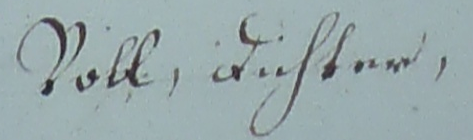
Volk, Dichter,
